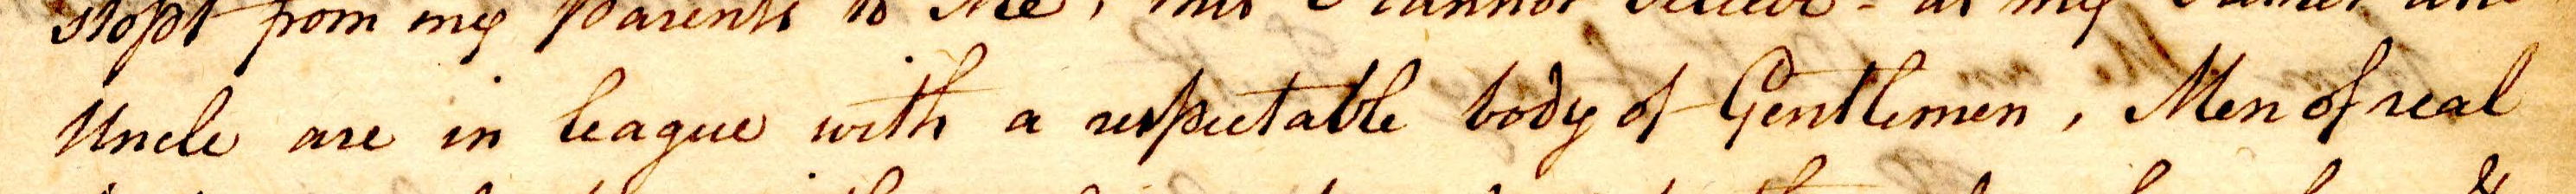Uncle are in league with a respectable body of Gentlemen, Men of real
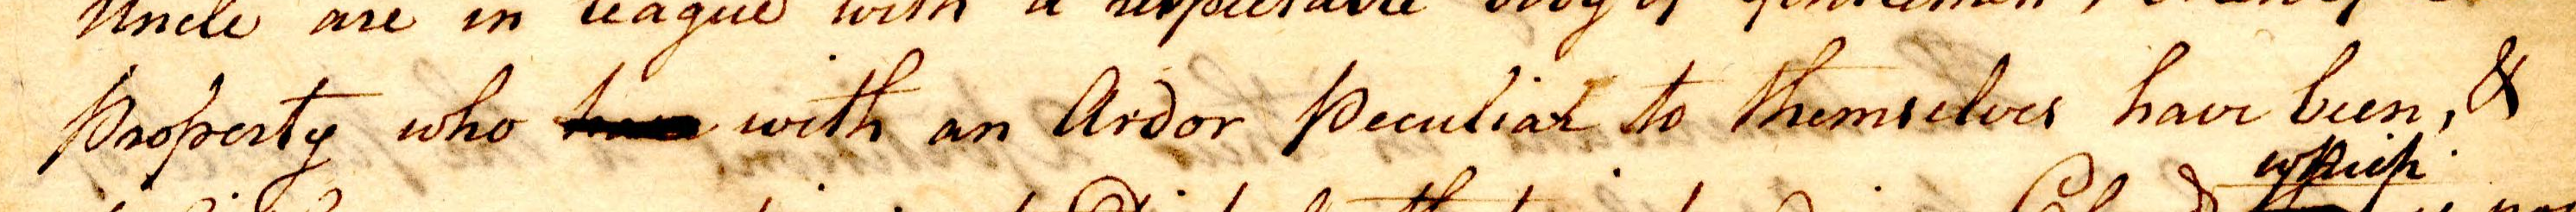property who have with an Ardor peculiar to themselves have been, &
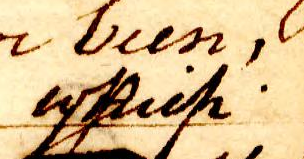which
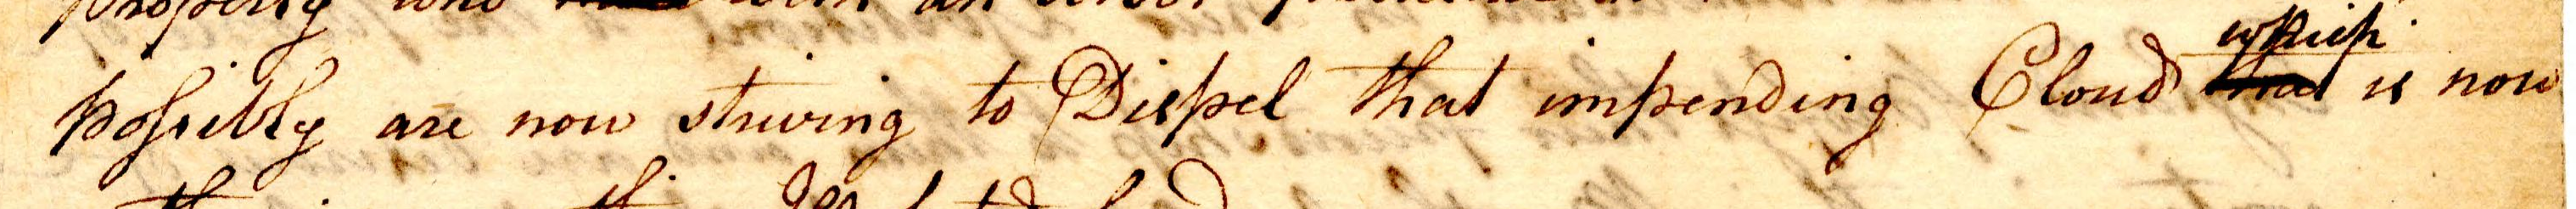possibly are now striving to Dispel that impending Cloud ^ that is now
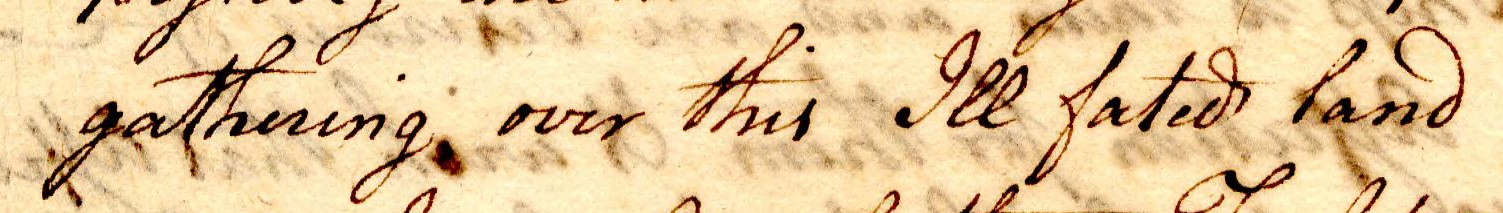gathering over this Ill fated land.
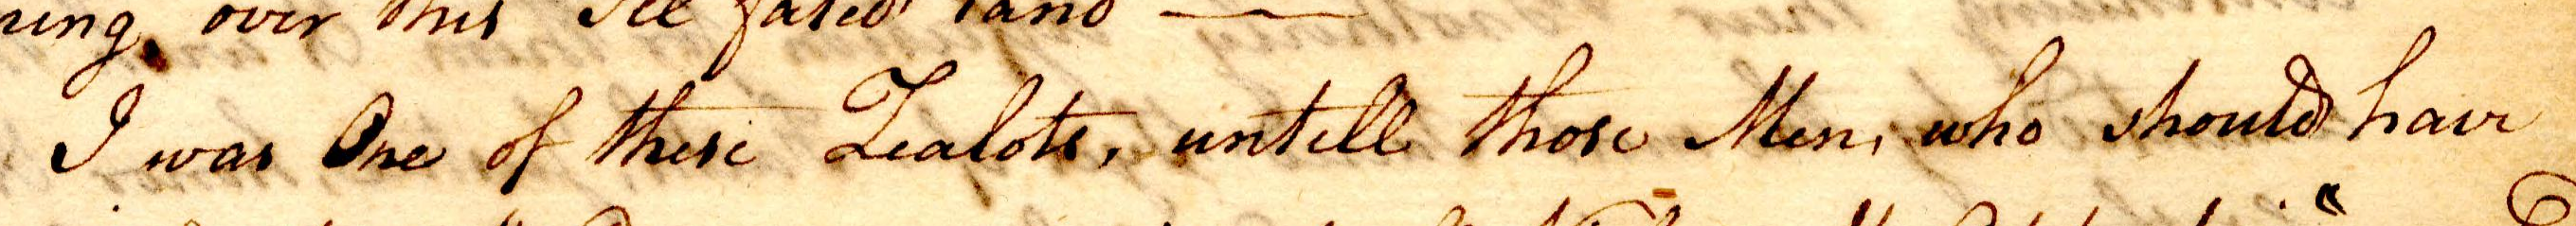I was One of these Zealots, untill those Men, who should have
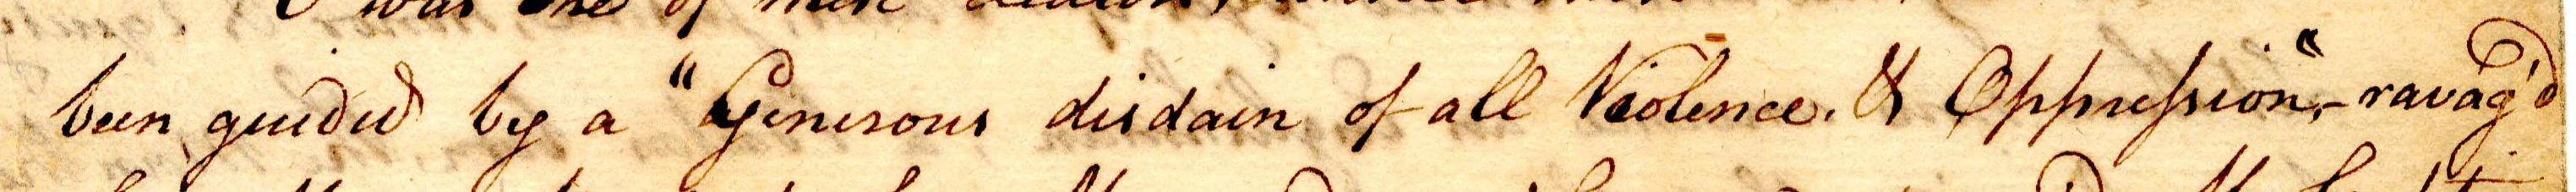been guided by a "Generous disdain of all Violence & Oppression," ravag'd
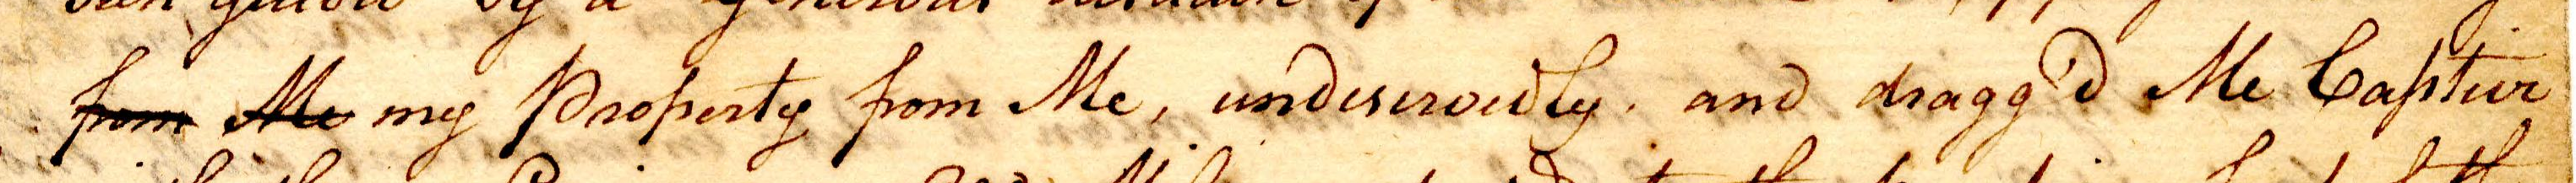from Me my property from Me, undeservedly and dragg'd Me Captive
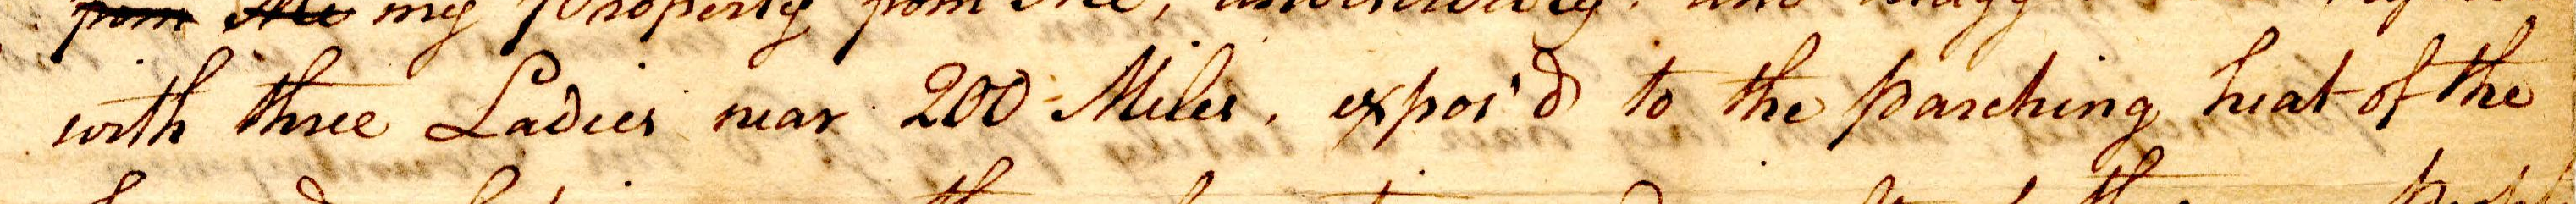with three Ladies near 200 Miles expos'd to the parching heat of the
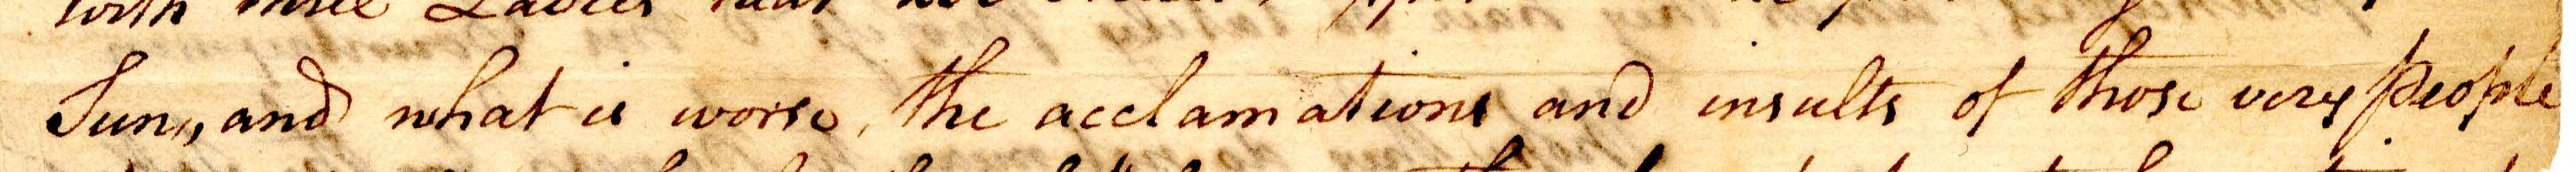Suns, and what is worse, the acclamations and insults of those very people
